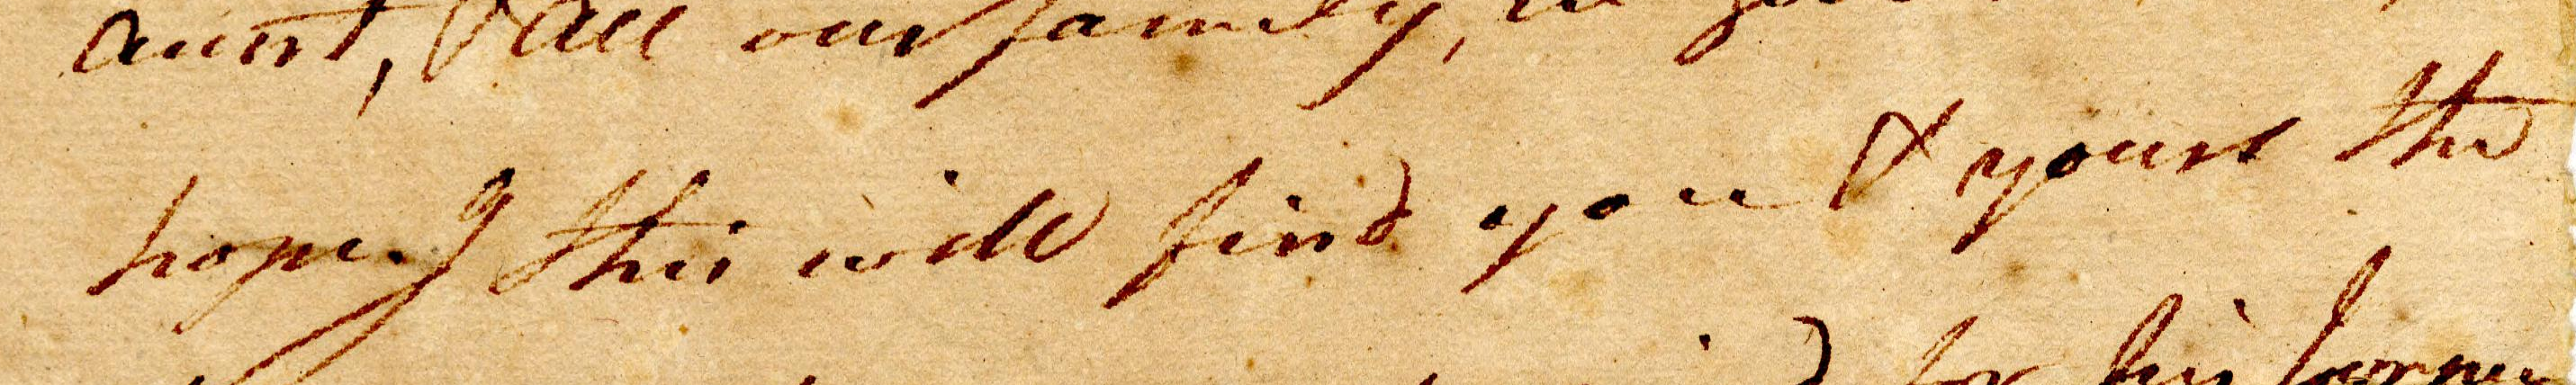hope I this will find you & yours the
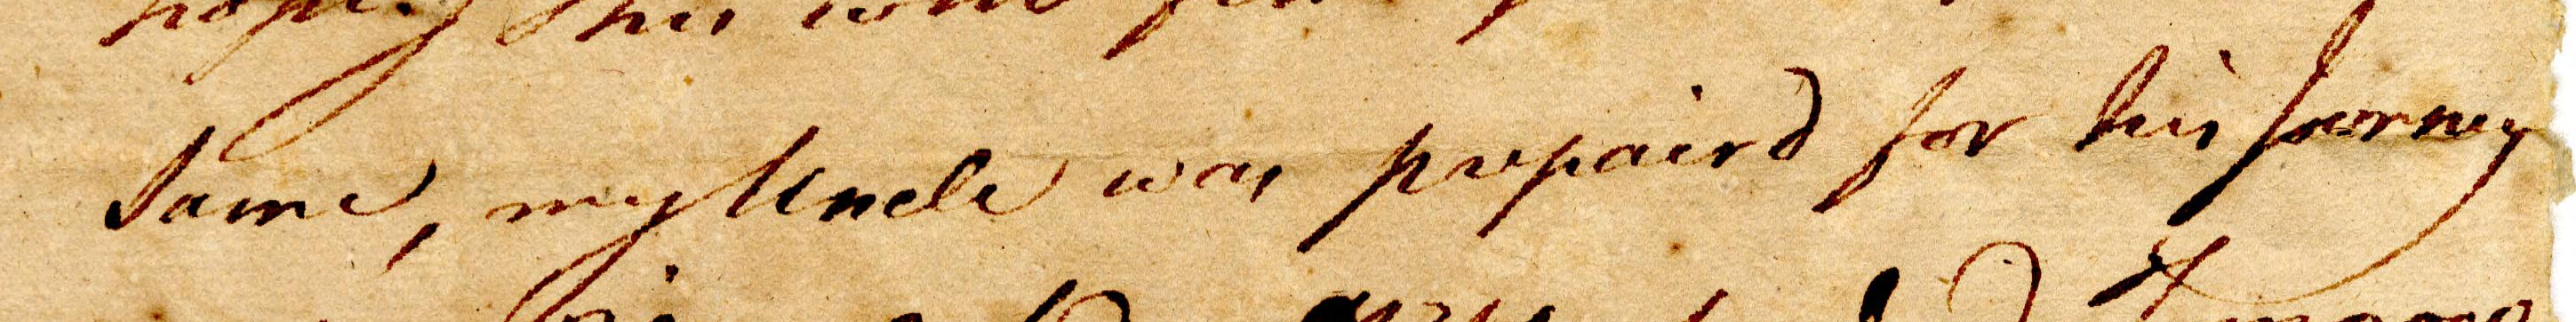same, my Uncle was prepaird for his Journey
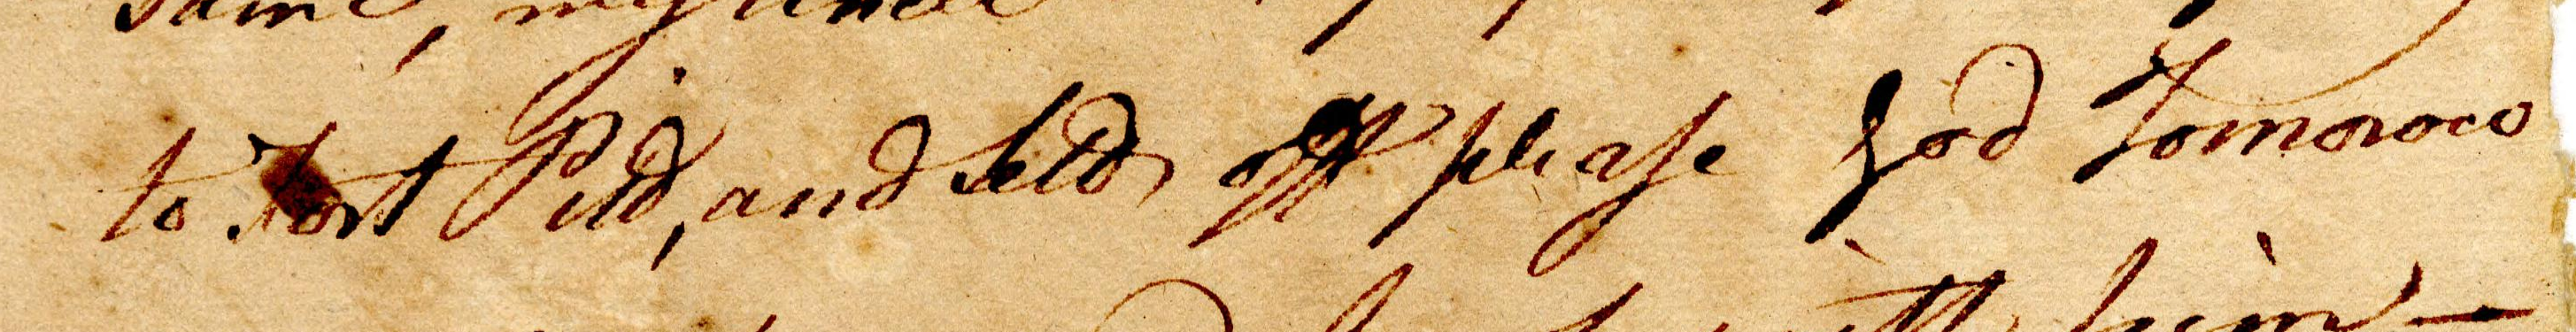to Fort Pitt, and sold off please God Tomorrow
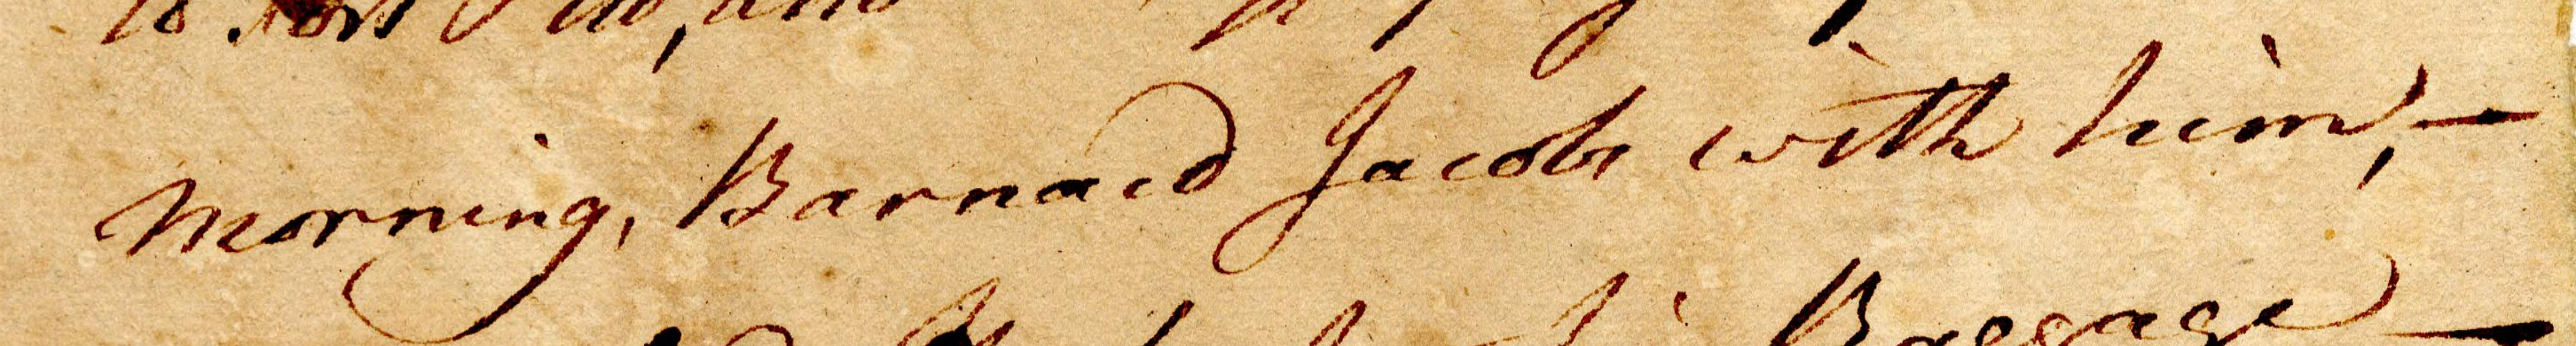morning, Barnard Jacobs with him,-
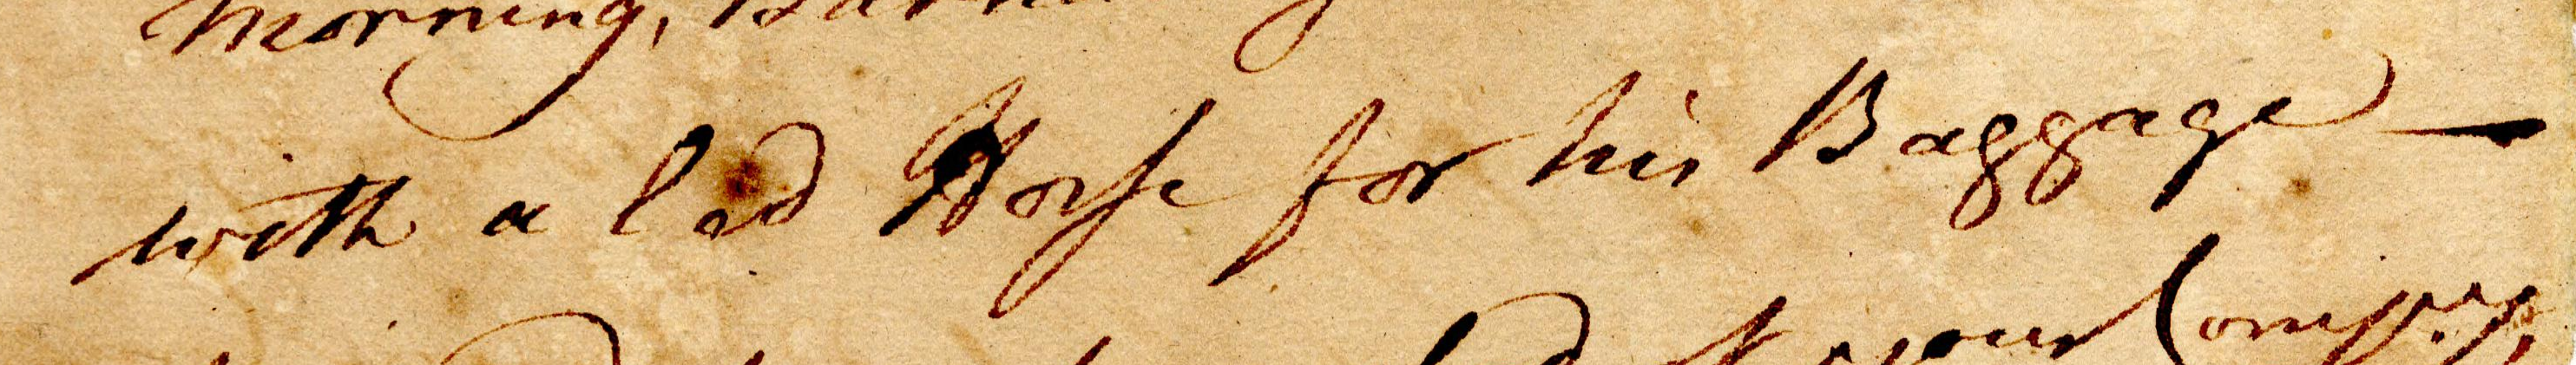with a led Horse for his Baggage-
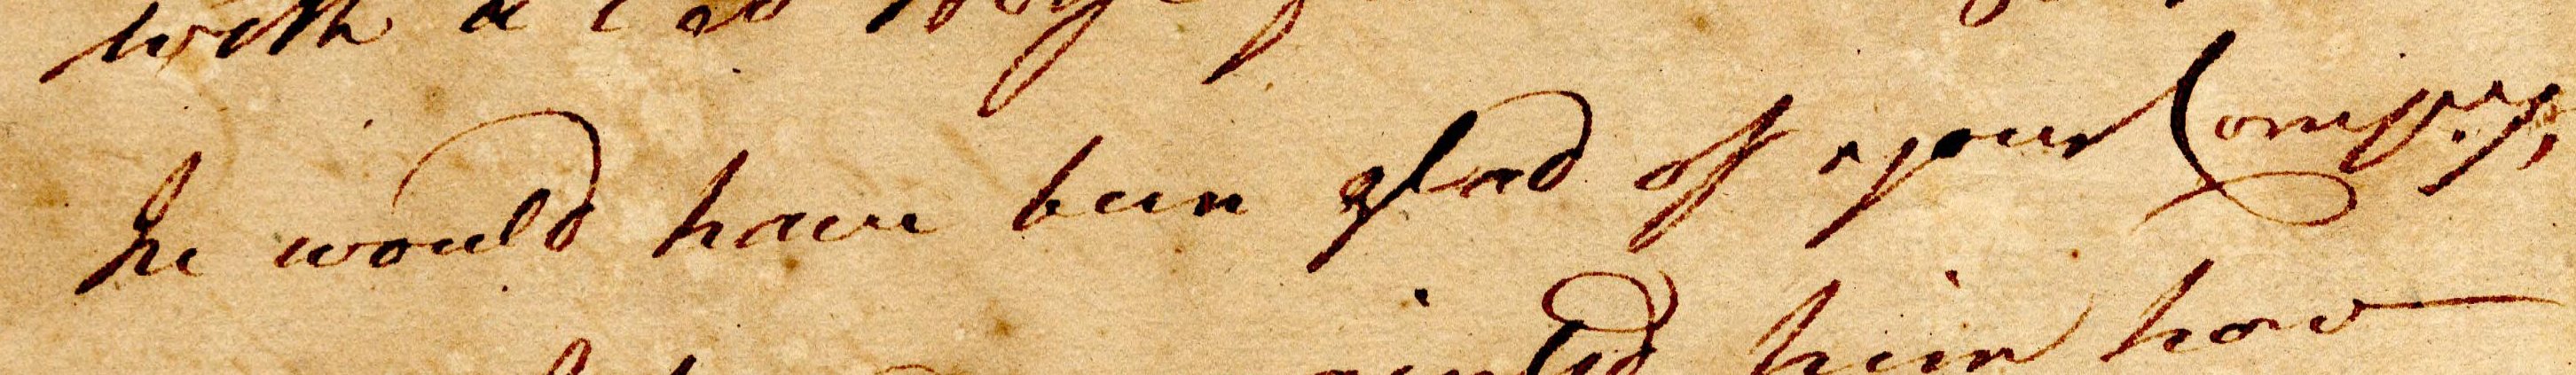he would have been glad of your Compy,
